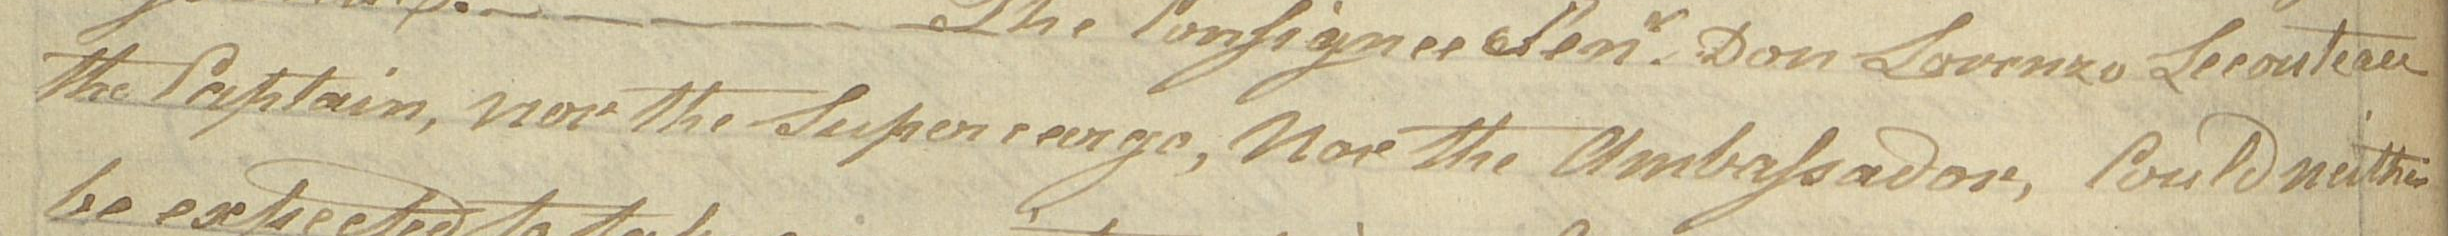The Captain, nor the Super cargo, Nor the Ambassador, Could neither
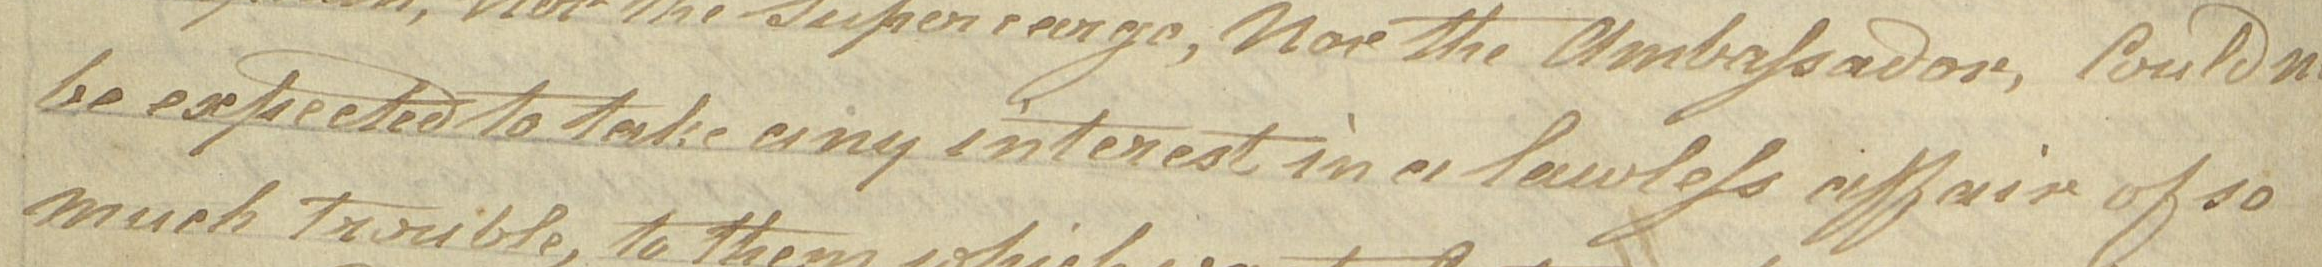be expected to take any interest in a lawless affair of so
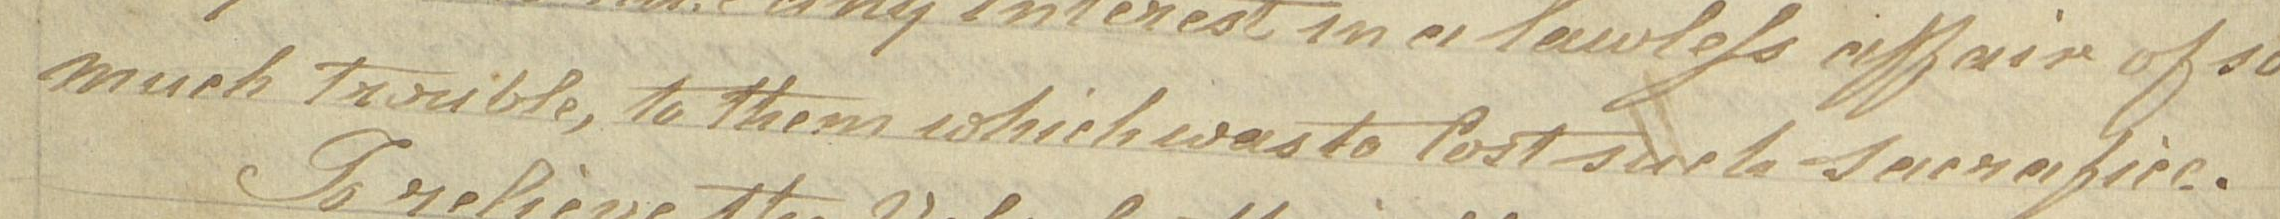much trouble, to them which was to Cost such sacrafice.
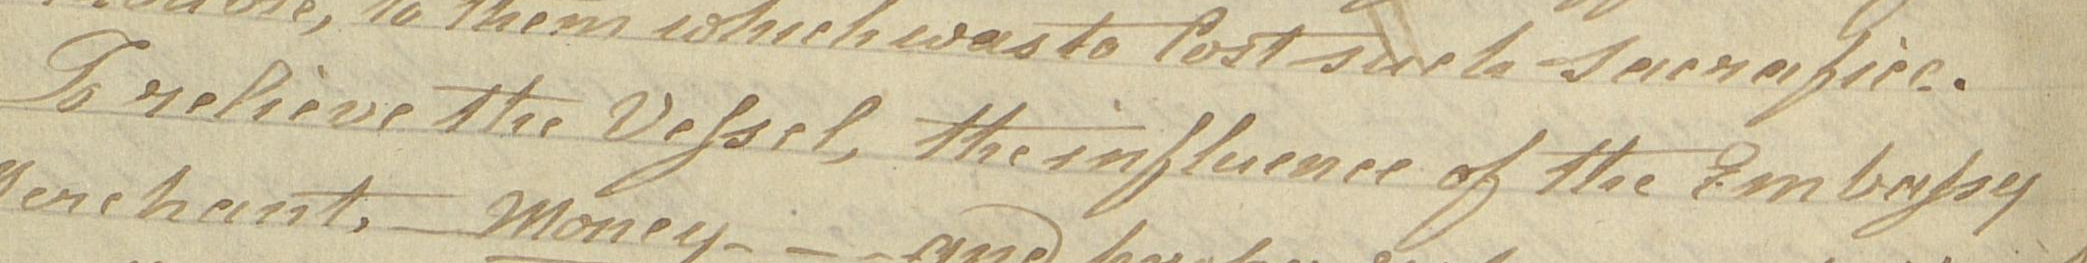To relieve the Vessel the influence of the Embassy
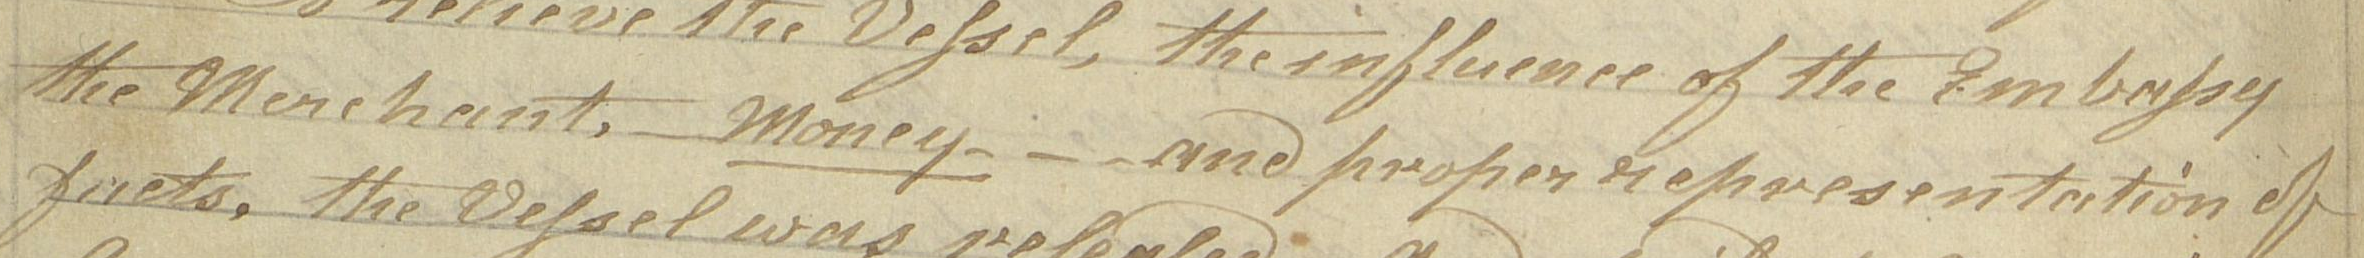the Merchant, Money, and proper representation of
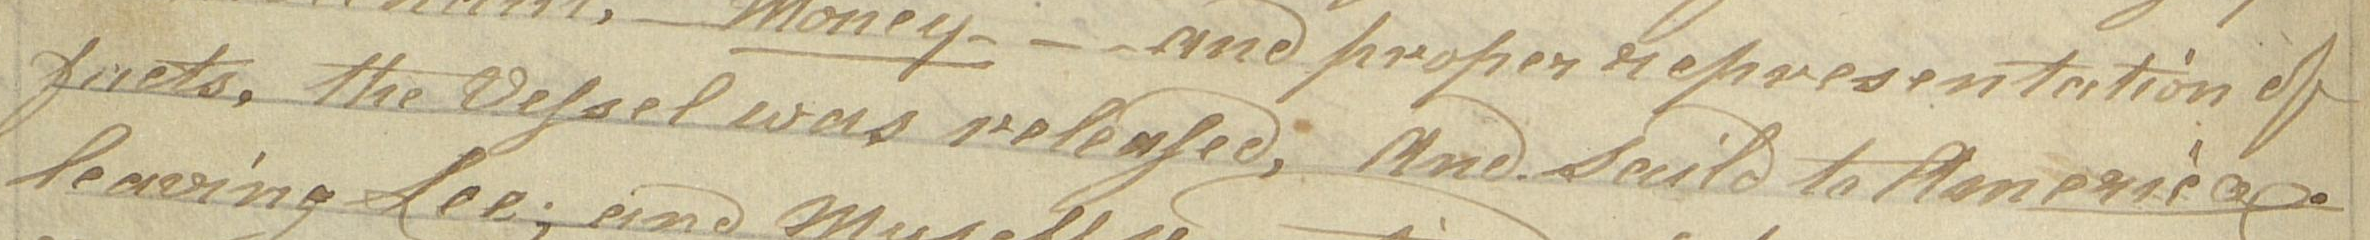facts, the Vessel was released, And sail'd to America.
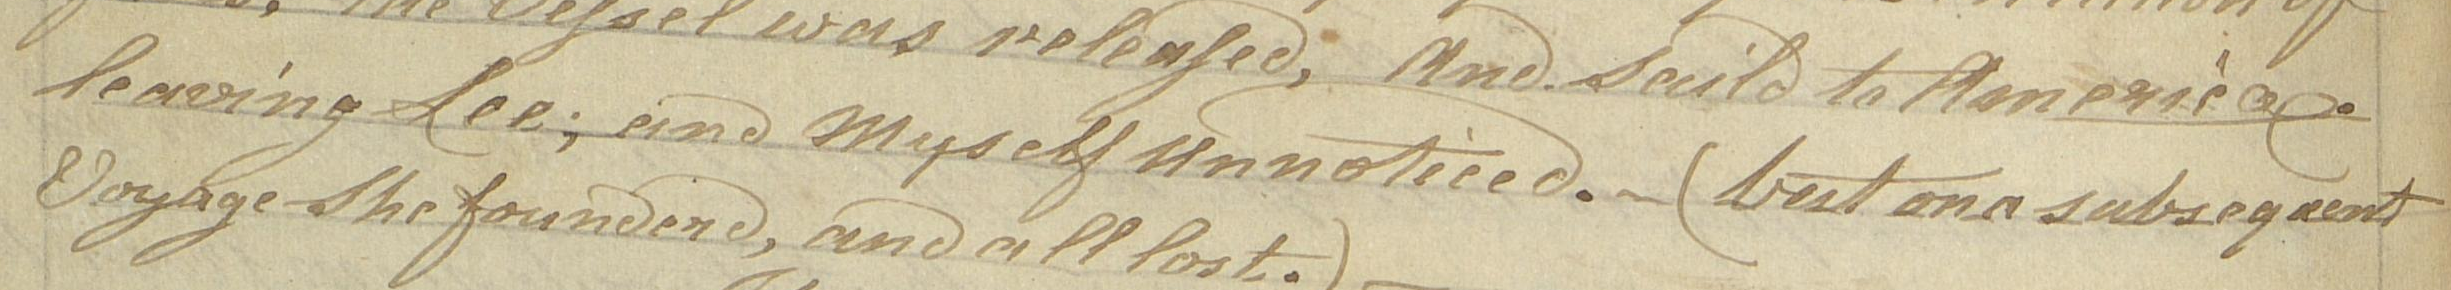leaving Lee; and Myself unnoticed. (but on a subsequent
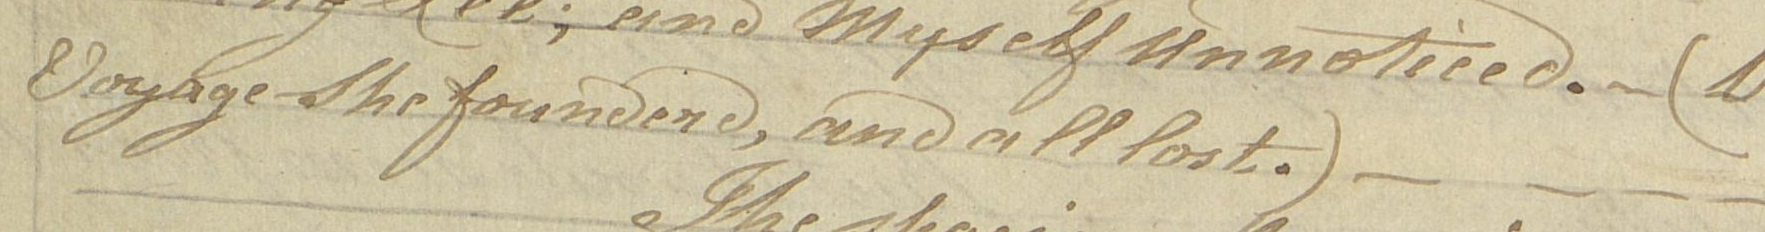Voyage She founderd, and all lost.)
